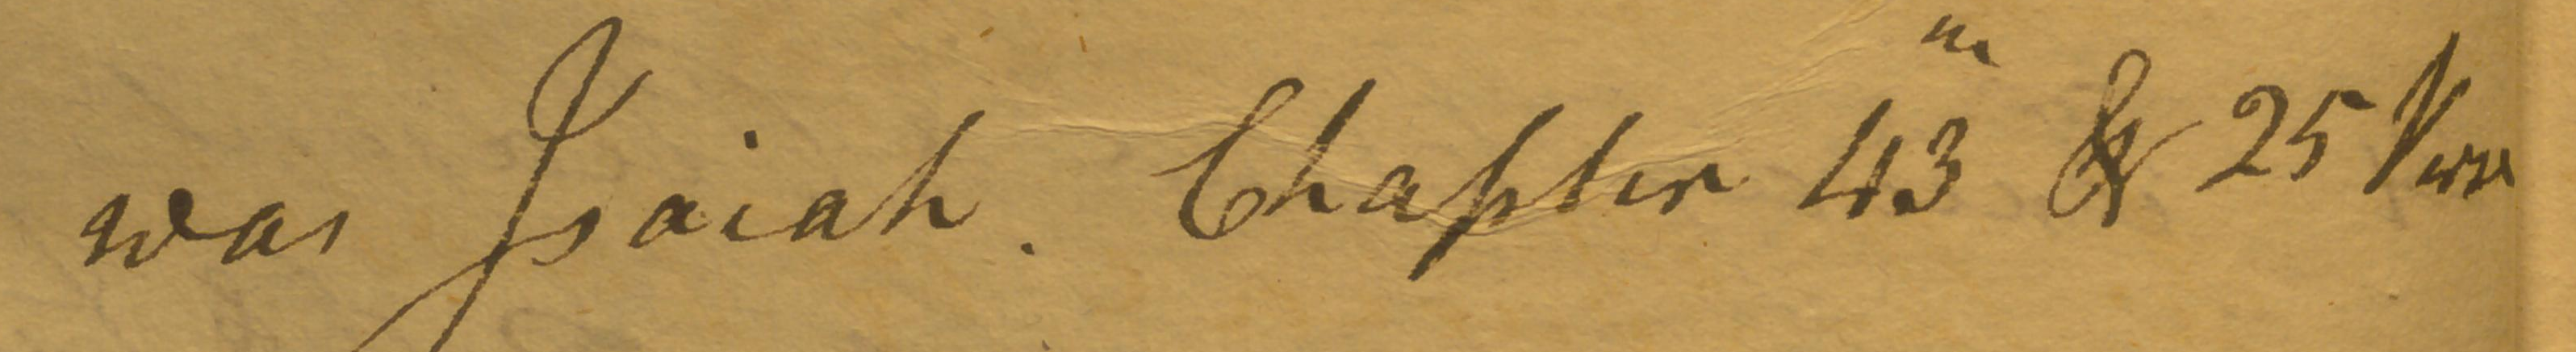was Isaiah Chapter 43^th & 25 Vers
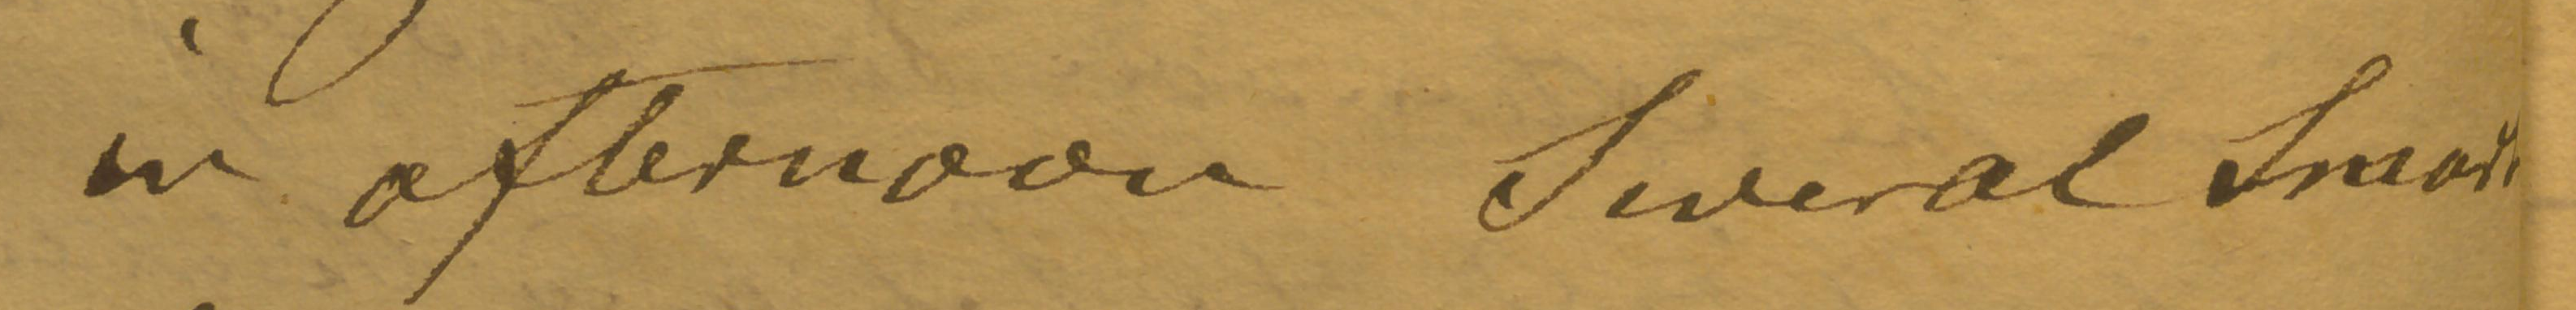in afternoon Several smart
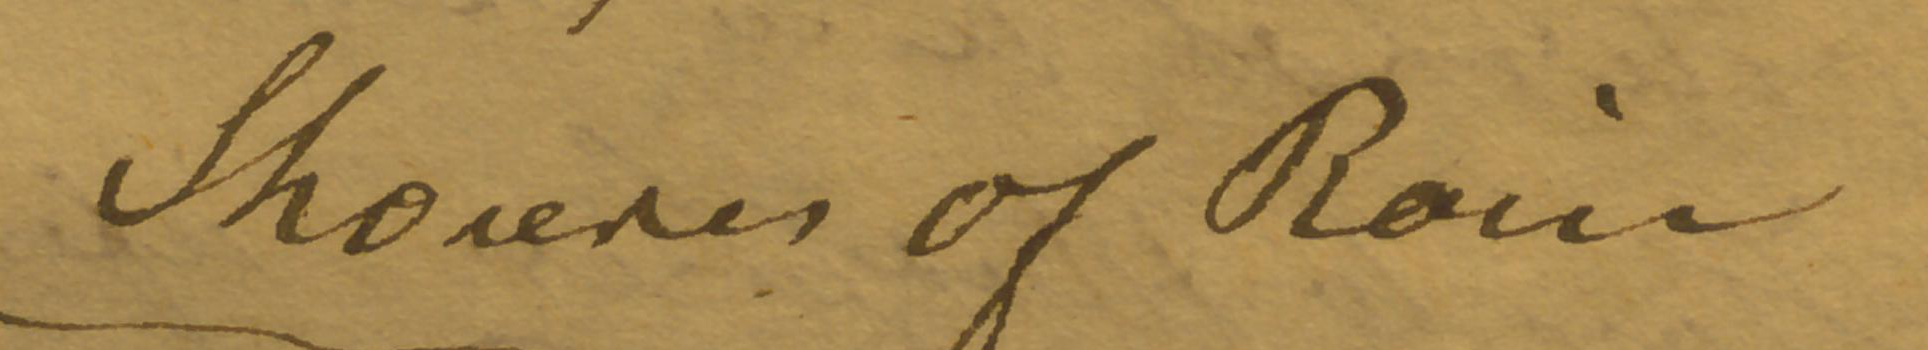Shoures of Roin
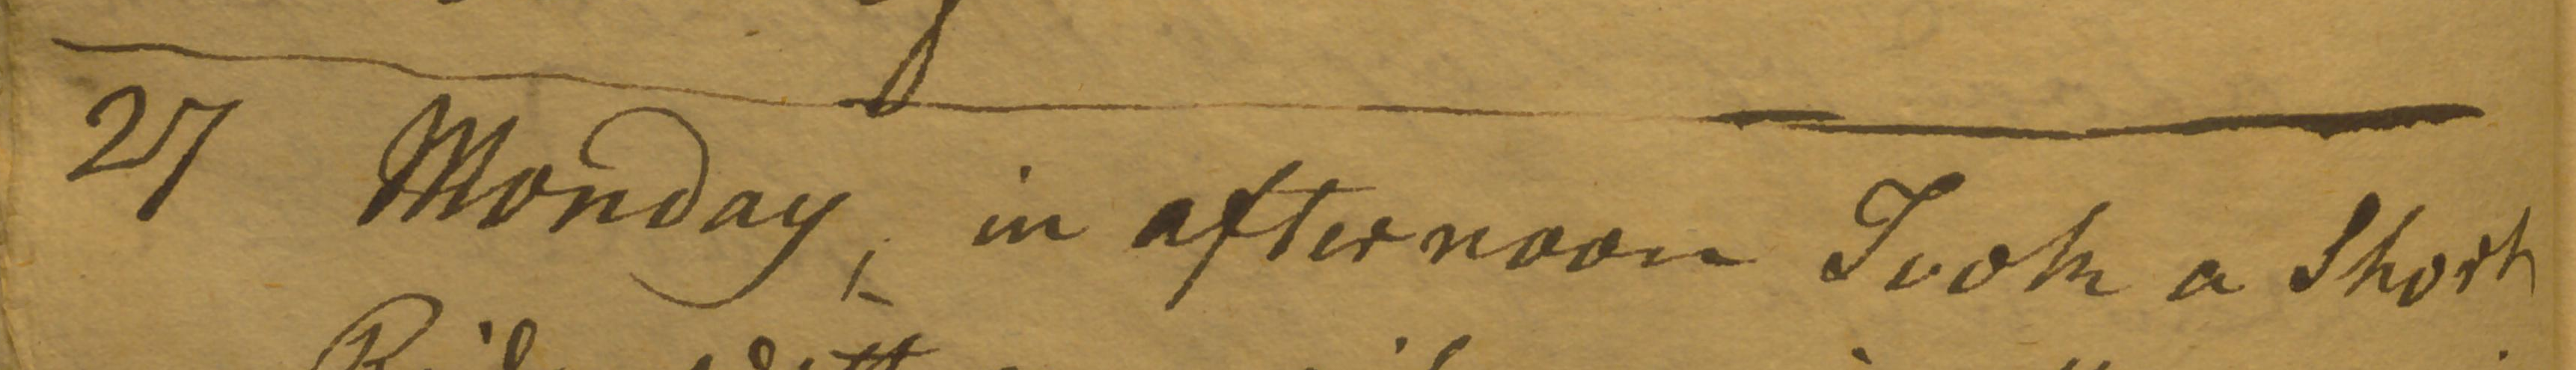27 Monday, in afternoon Took a Short
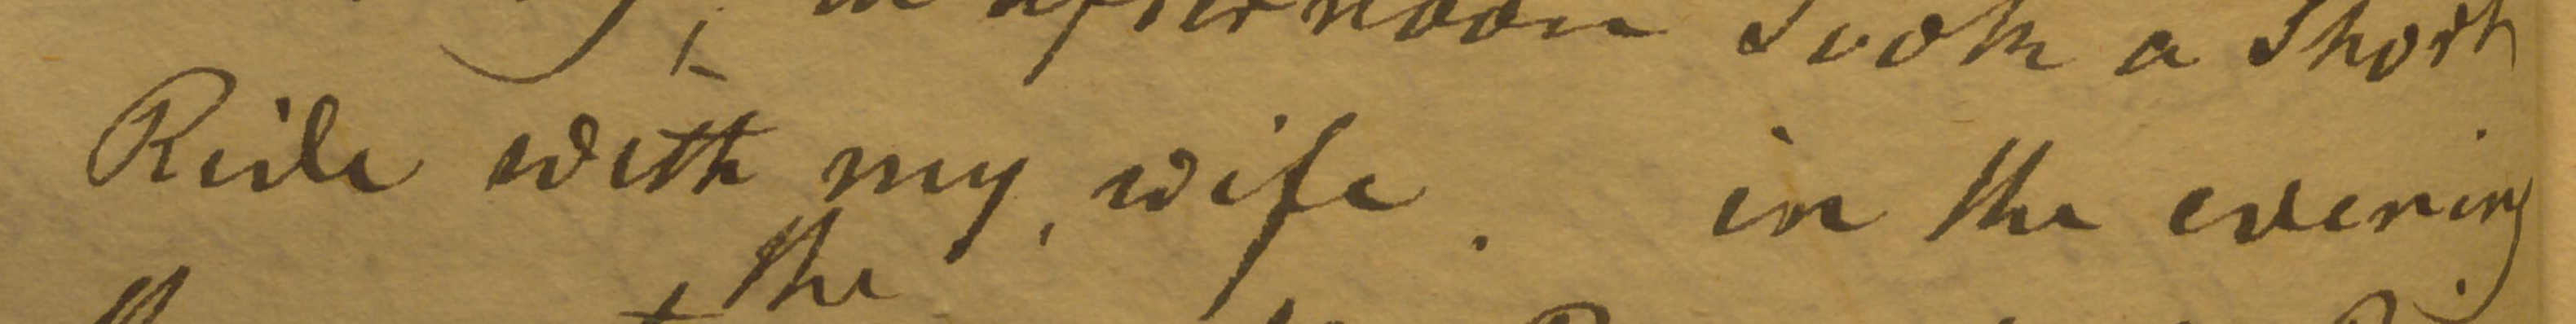Ride with my wife in the evening
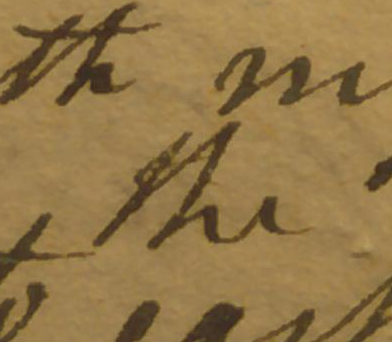the
